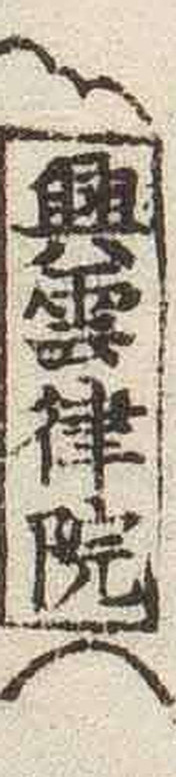興雲律院

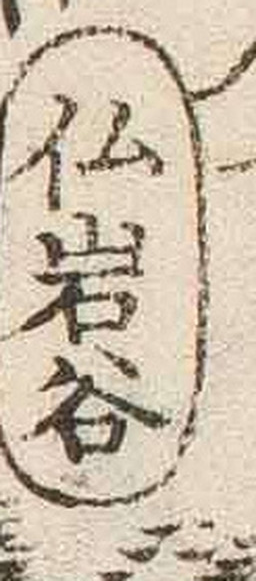仏岩谷
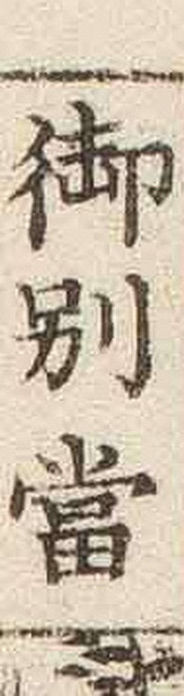御別當
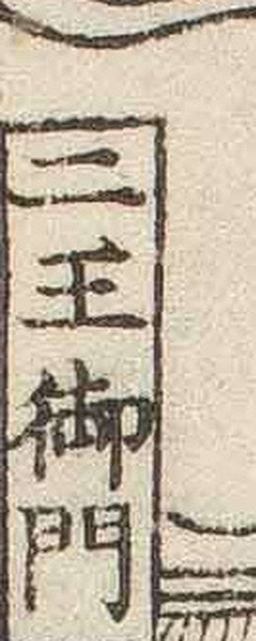二王御門
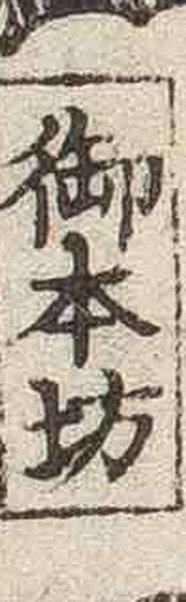御本坊

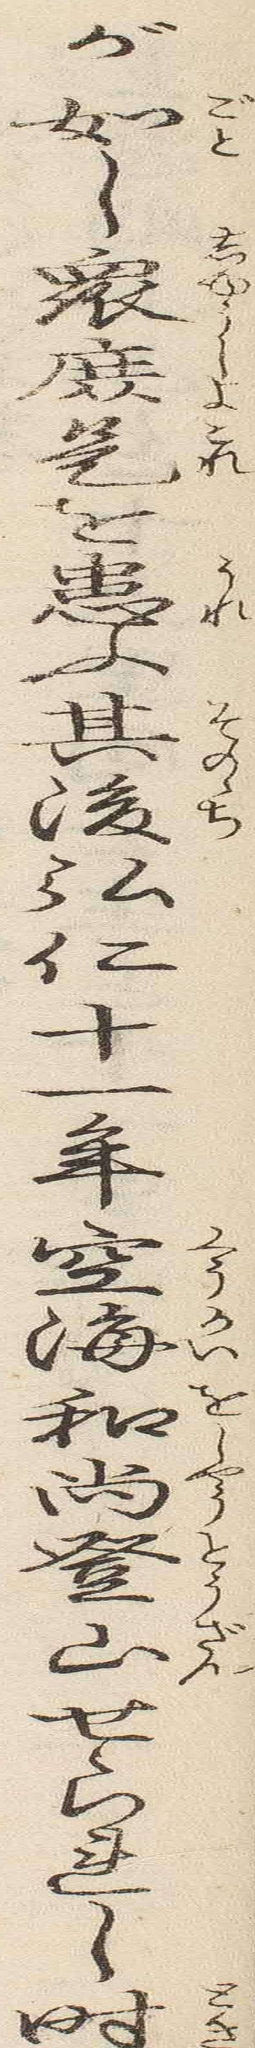が如し衆庶是を患ふ其後弘仁十一年空海和尚登山せられし时
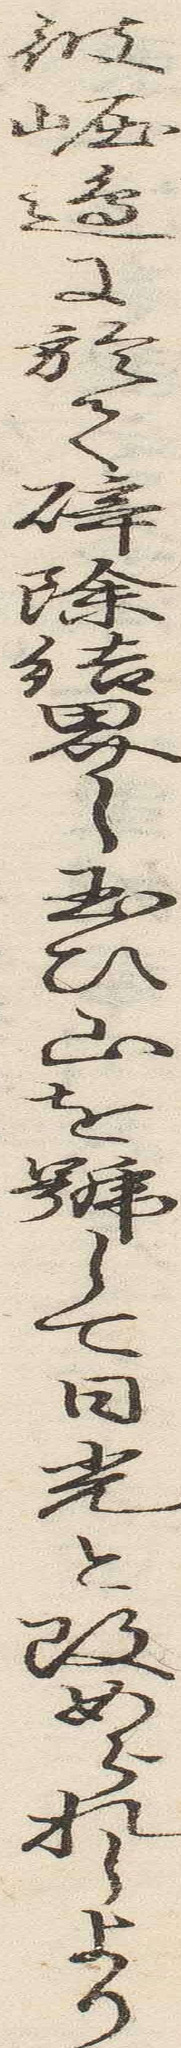彼崛邊に於て辟除結界し玉ひ山を號して日光と改められしより
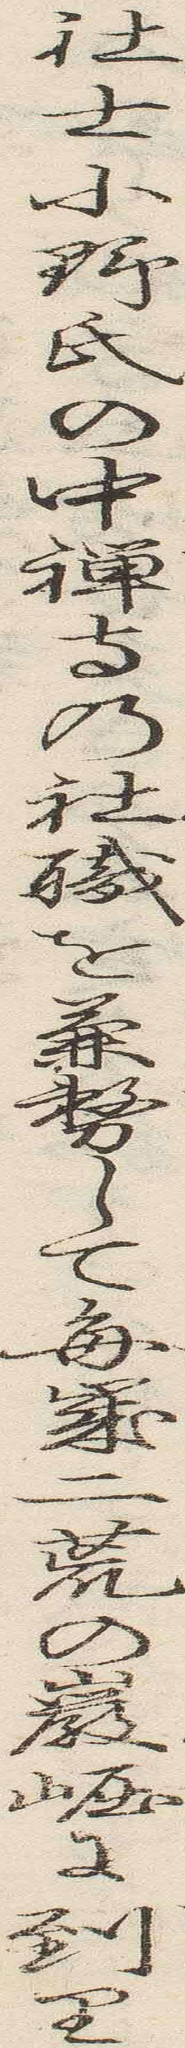社士小野氏の中禅寺の社職を兼務して毎歳二荒の巌崛に到り
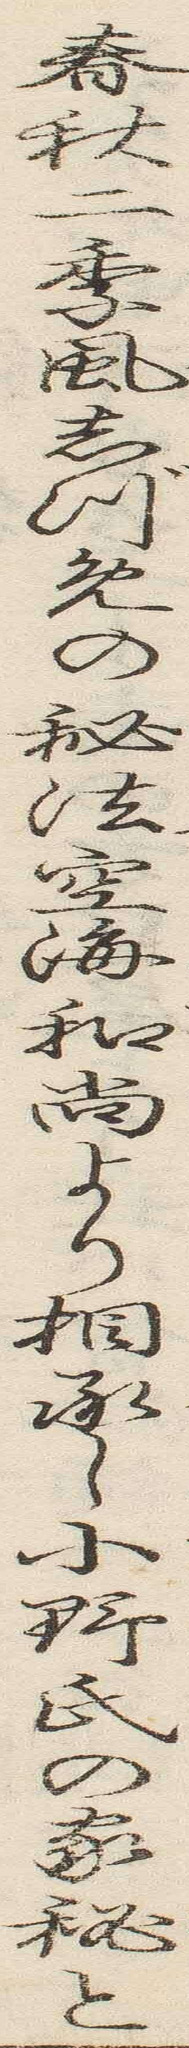春秋二季風しづめの秘法空海和尚より相承し小野氏の家秘と
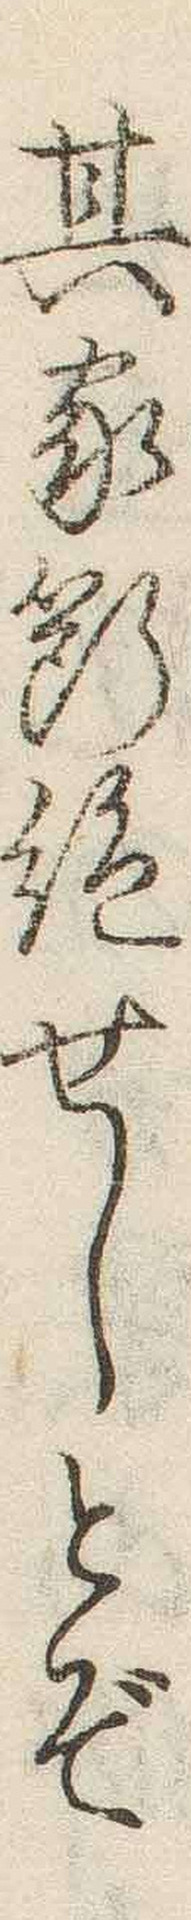其家断絶せしとぞ
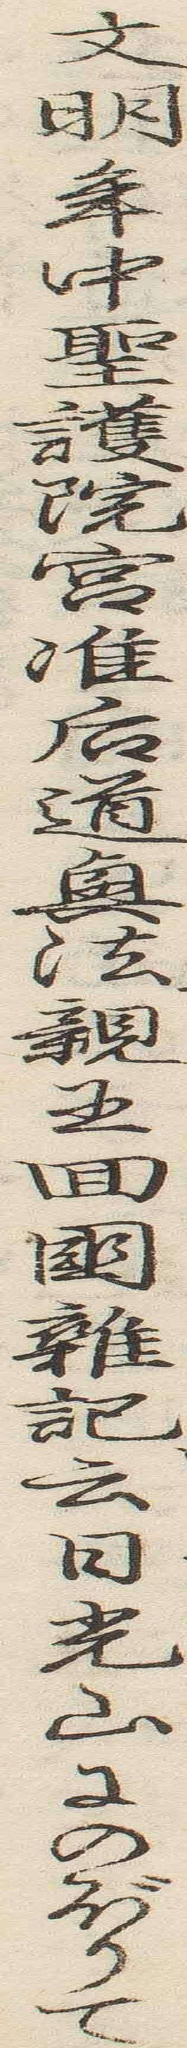文明年中聖護院宮准后道興法親王囬國雜記云日光山にのぼりて
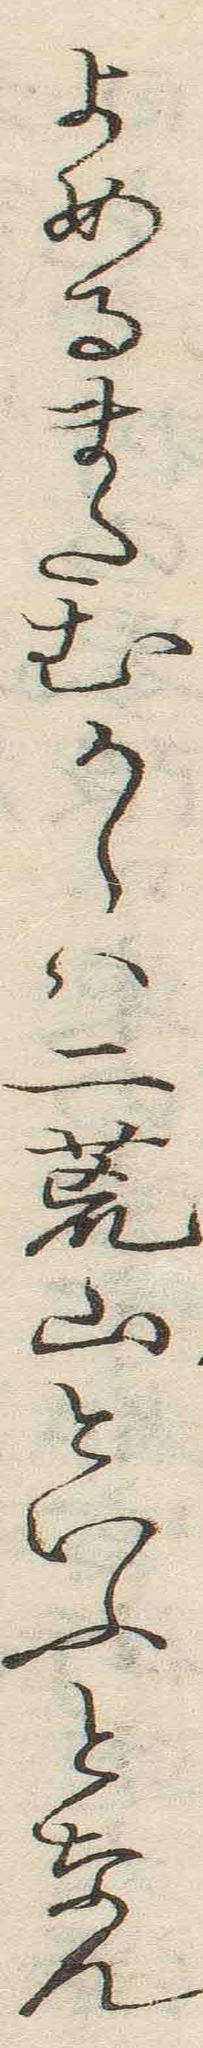よめるまたむかしは二荒山といふとなん
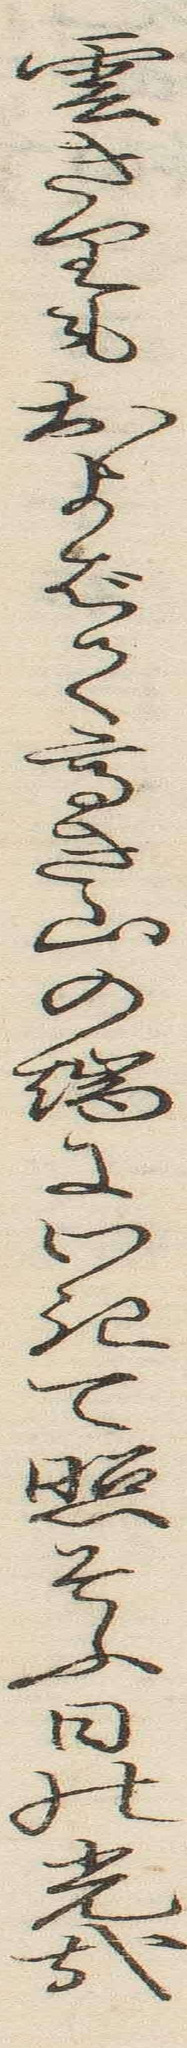雲きりもおよばて高き山の端にわけて照そふ日の光哉
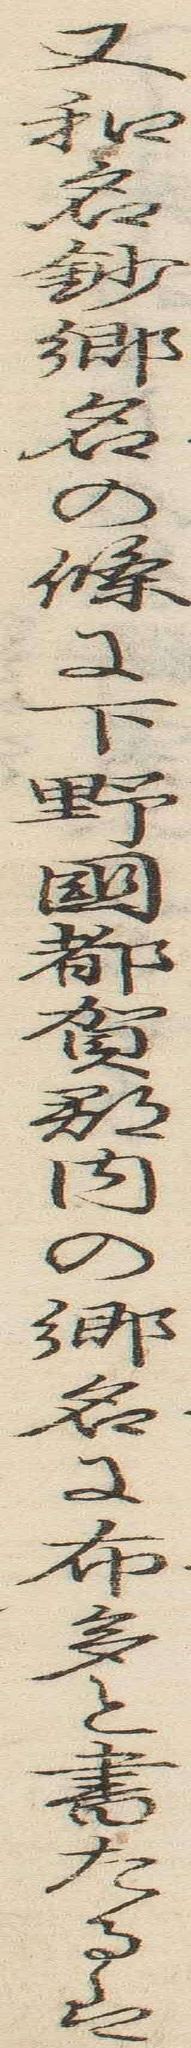又和名鈔郷名の條に下野國都賀郡内の郷名に布多と書たるは
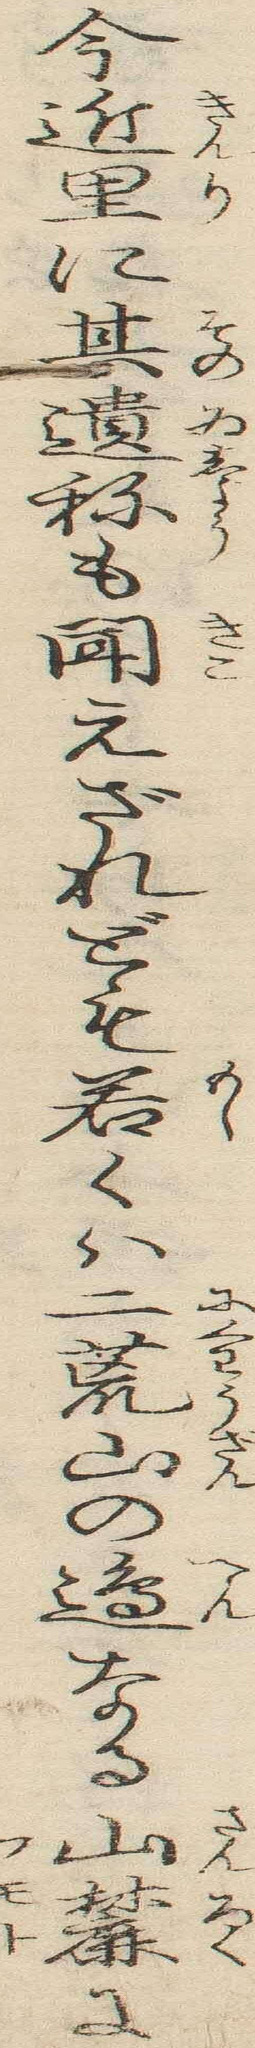今近里に其遺称も聞えざれども若くは二荒山の邊なる山麓に

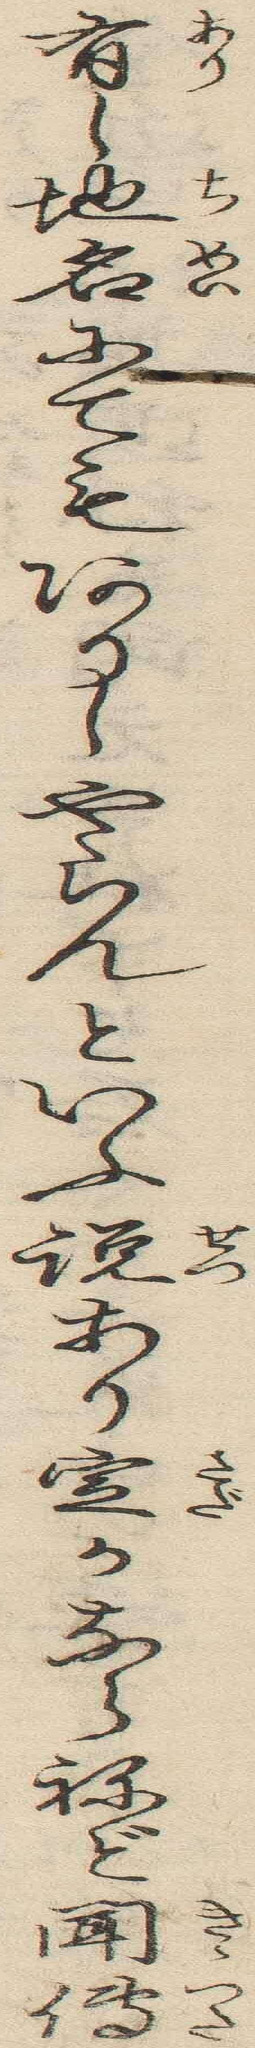有し地名にてもありしやらんといふ説あり定かならねど聞傳
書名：日光山志
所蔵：東京学芸大学附属図書館 国文学研究資料館
